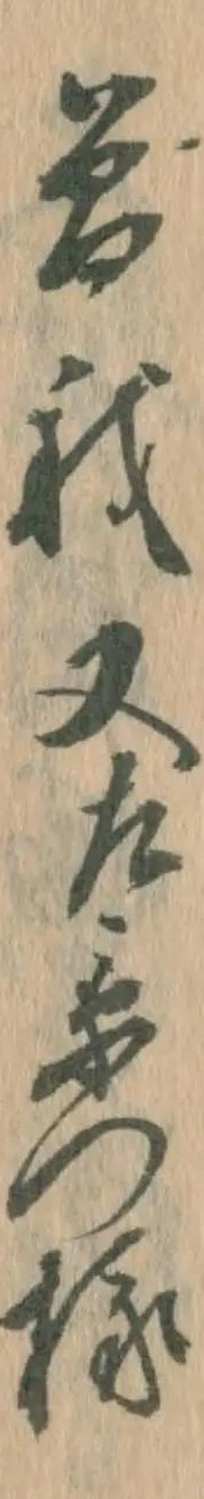曽我又左衛門様
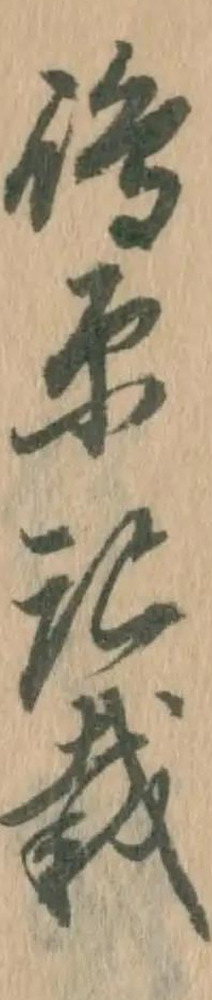島原記載
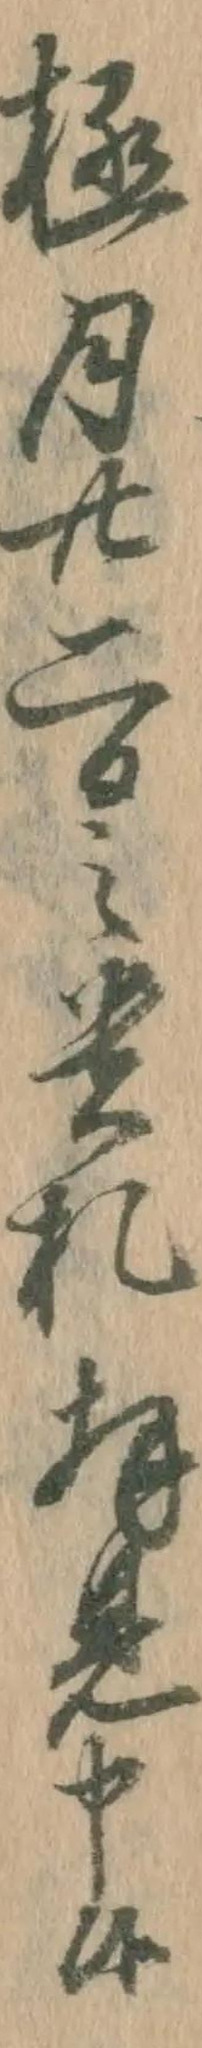極月廿二日之貴札拝見申候
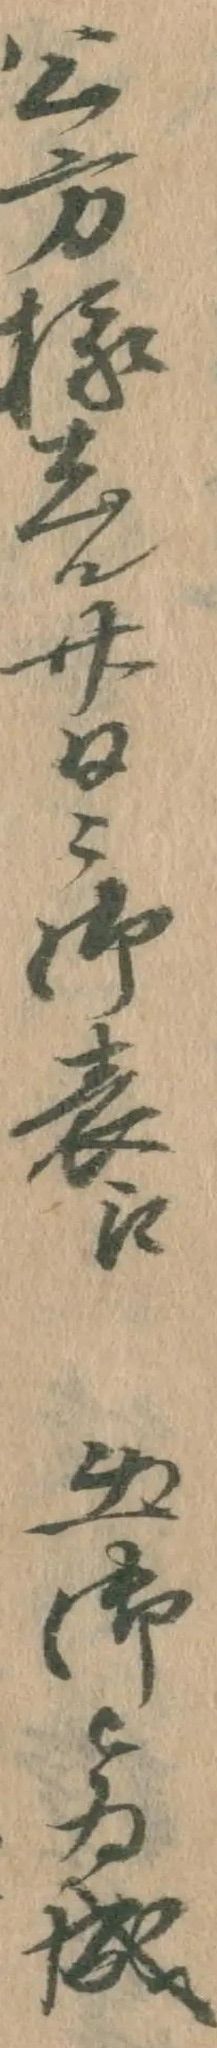公方様去る廿日に御表江出仰被為城
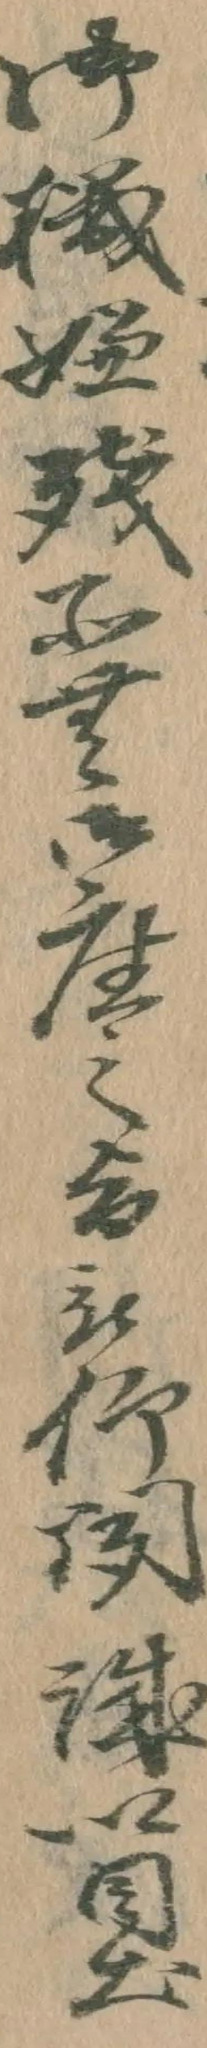御機嫌残所無御座之旨被仰聞城以目出
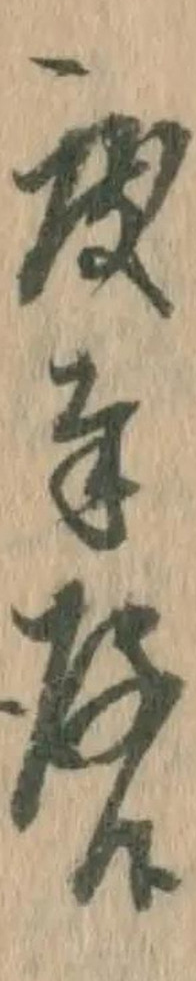度奉存候
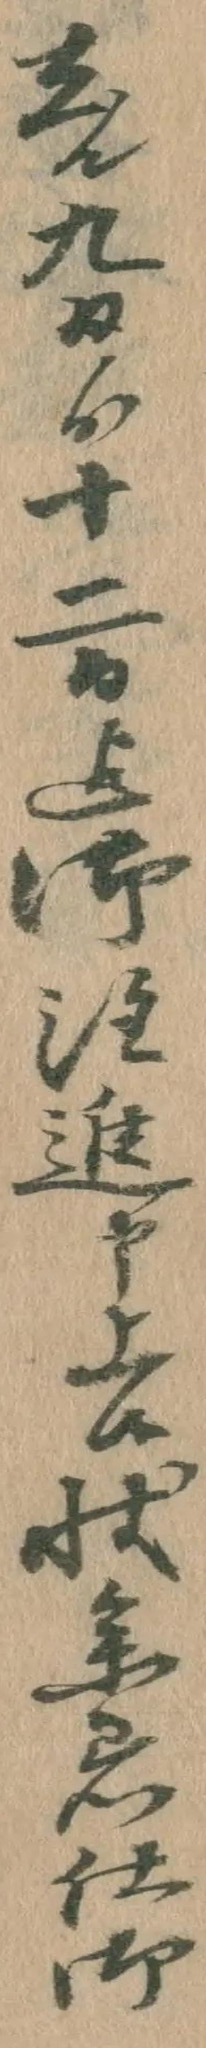一去る九日ゟ十二日迄御注進申上候状参着仕御
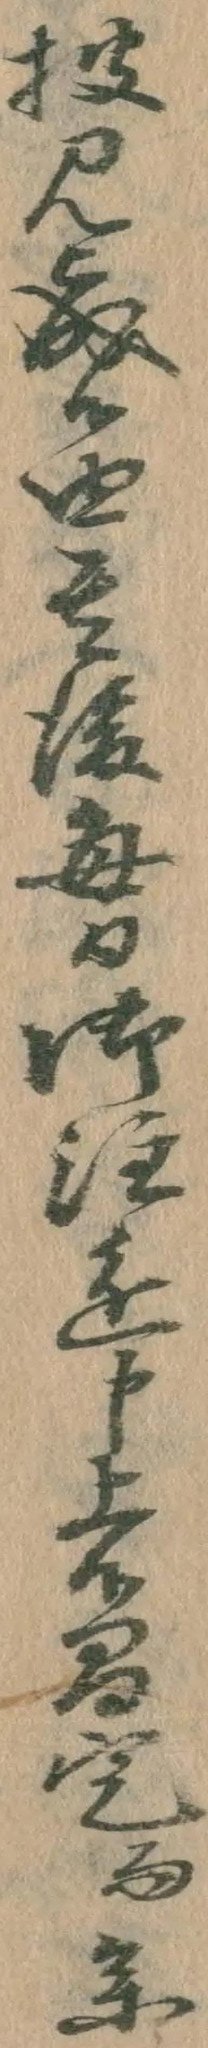披見被成候由其後毎日御注進申上候間定而参
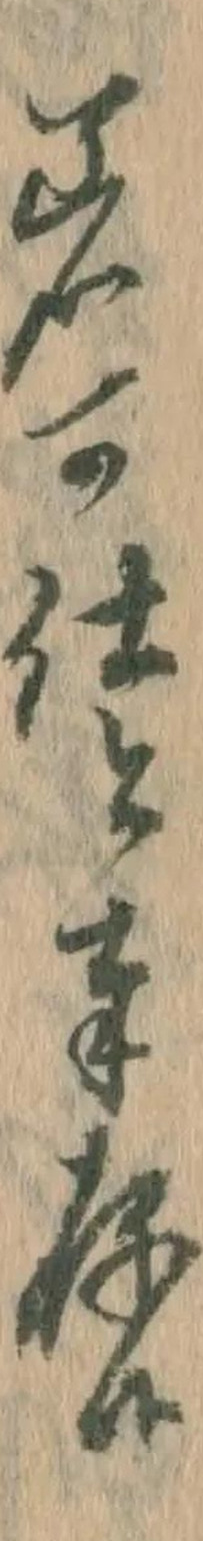着可仕と奉存候
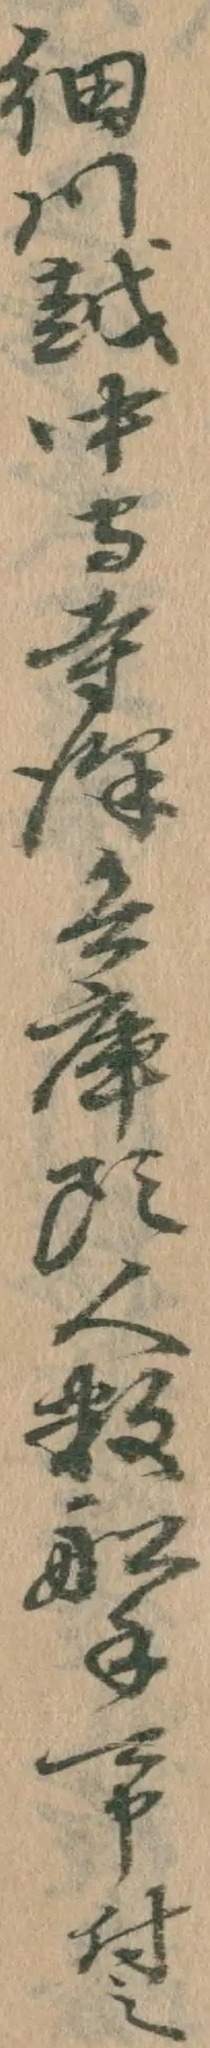一細川越中守寺沢兵庫頭人数舩手可申付之
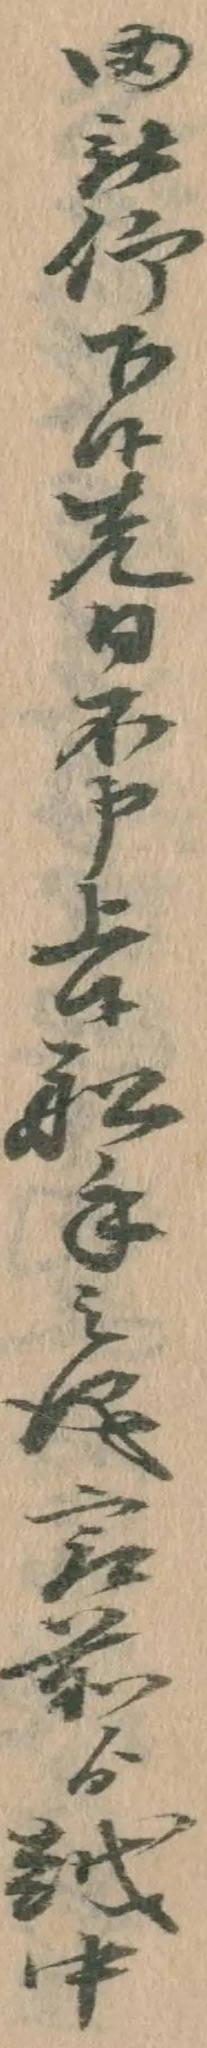由被仰下候先日不申上候舩手之儀最前ゟ越中
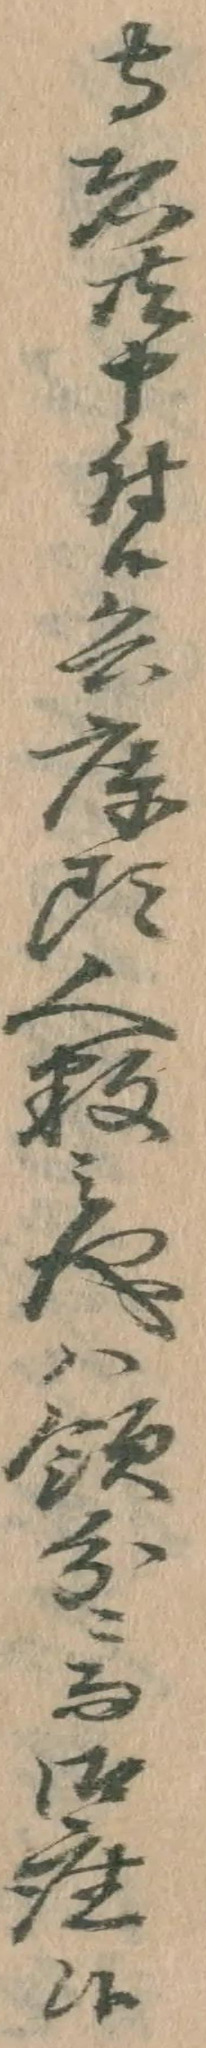守者供申付候兵庫頭人数之儀は領分に而御座候
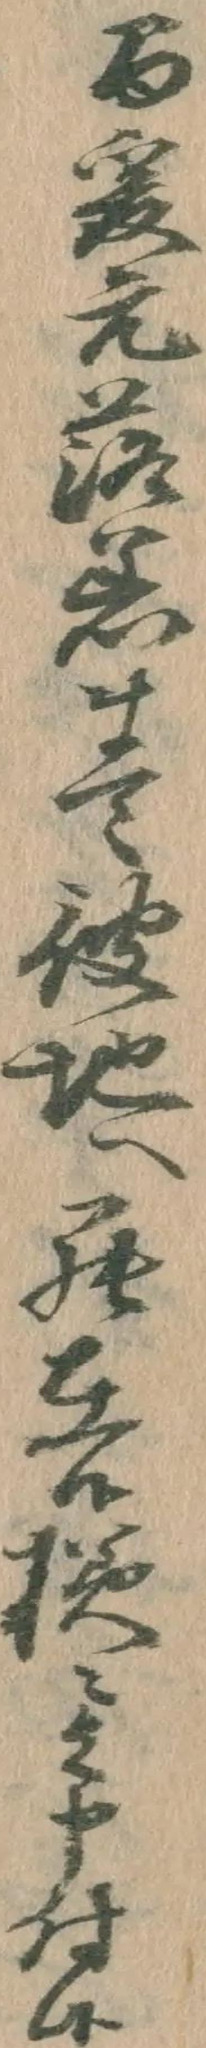間爰元落着まて彼地へ罷在候様に与申付候
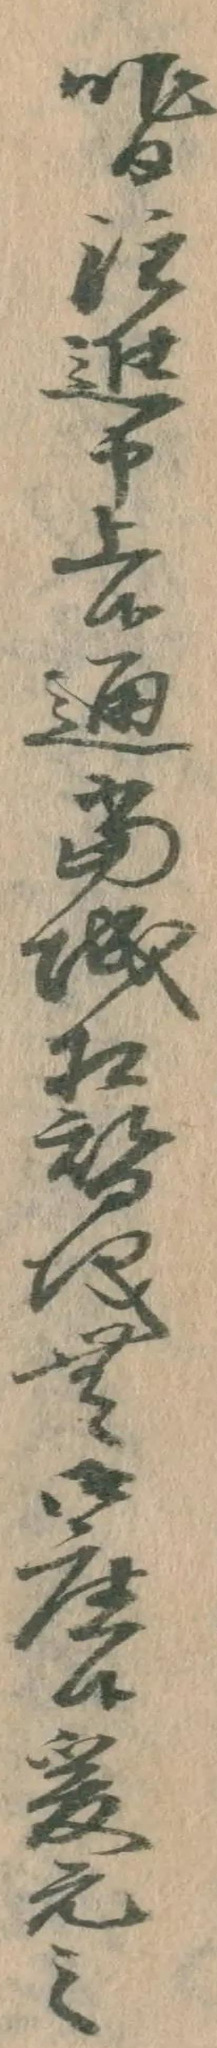一昨日注進申上候通当城相替儀無御座候爰元之
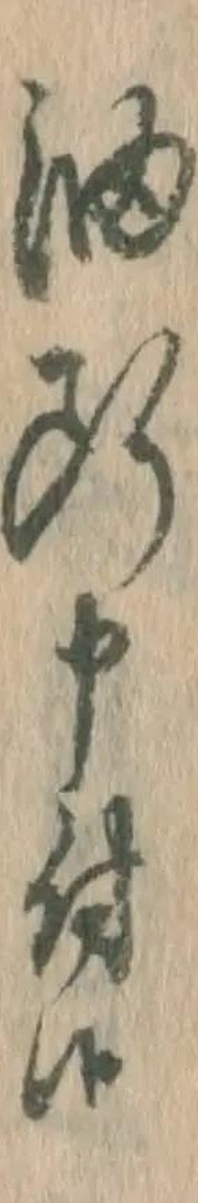油断申付候
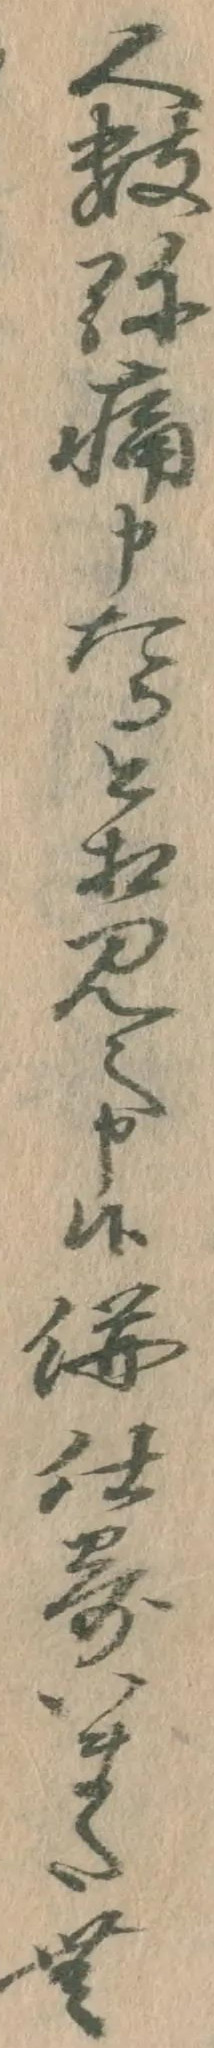人数弥痛申たると相見へ申候併仕寄いまた無
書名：切支丹御退治記 49巻. [5]
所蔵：国立国会図書館 National Diet Library, JAPAN
